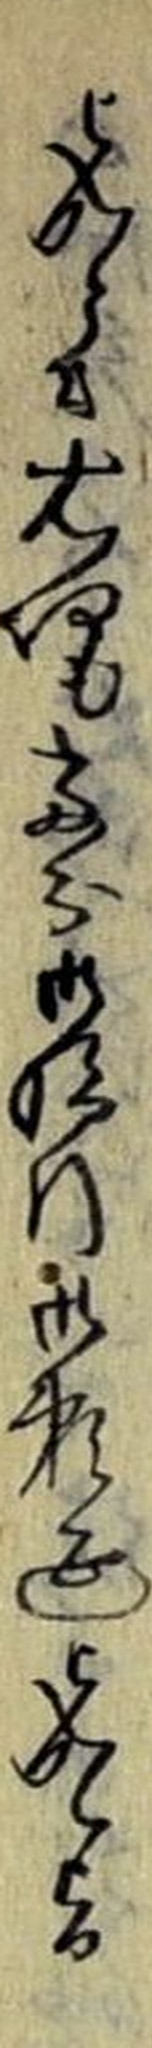被成候に付右何も当分御指引御頼延被成候旨
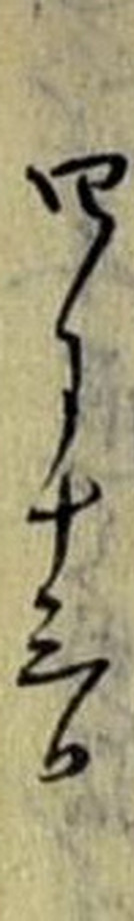四月十三日
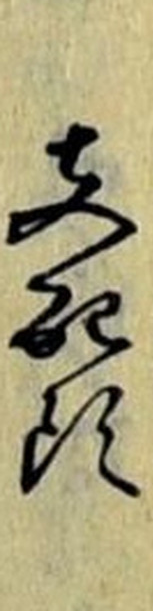支配頭
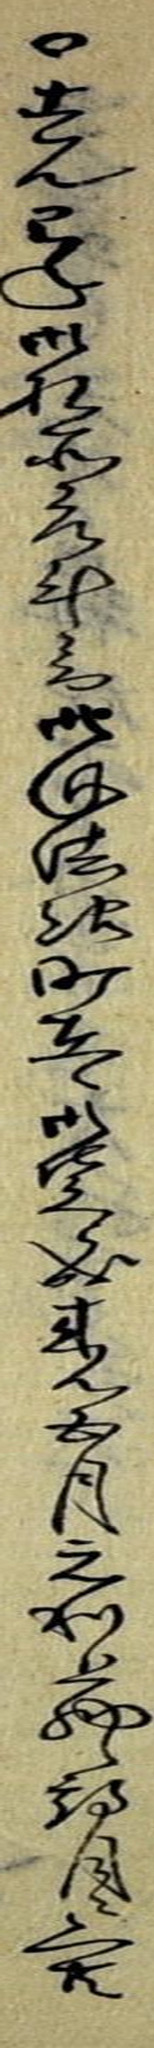○去る巳年御札所取斗に而御趣法銀町在へ御貸被成来る五月元利上納之期月に候へ共
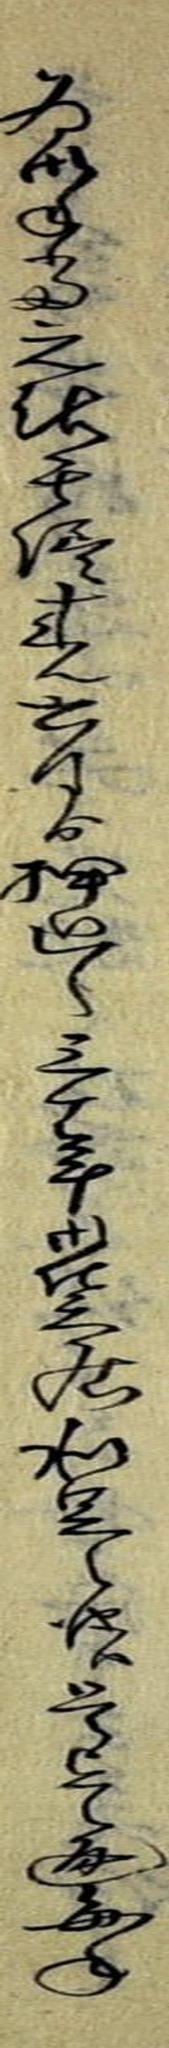為御手当元銀其侭来る六月ゟ押廻之三ヶ年御貸居利足之儀は是迄之通毎年
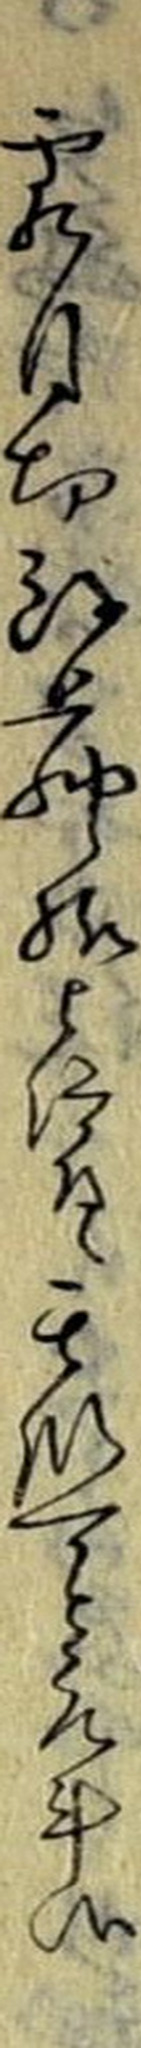霜月切致上納候様被仰付候其段可被取斗候
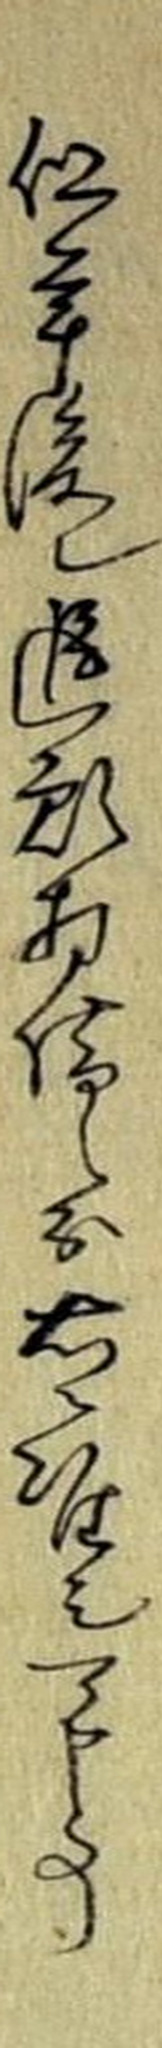但年後れ追願拝借之分右に准し可申事
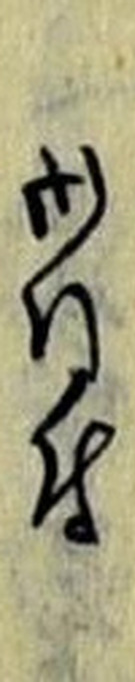御目付
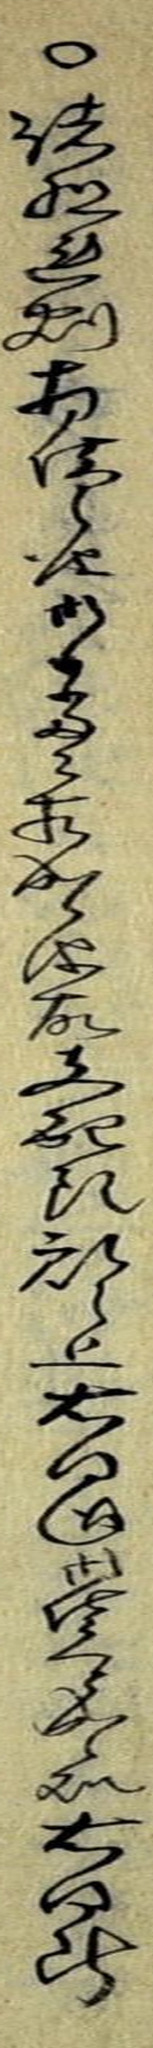○諸組連判拝借之儀御手当に相成候儀故支配頭願之上右同趣御貸被成候処右同断
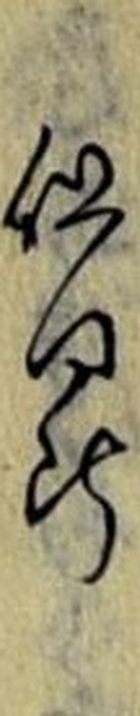但同断
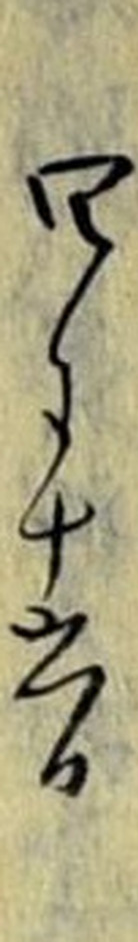四月十六日
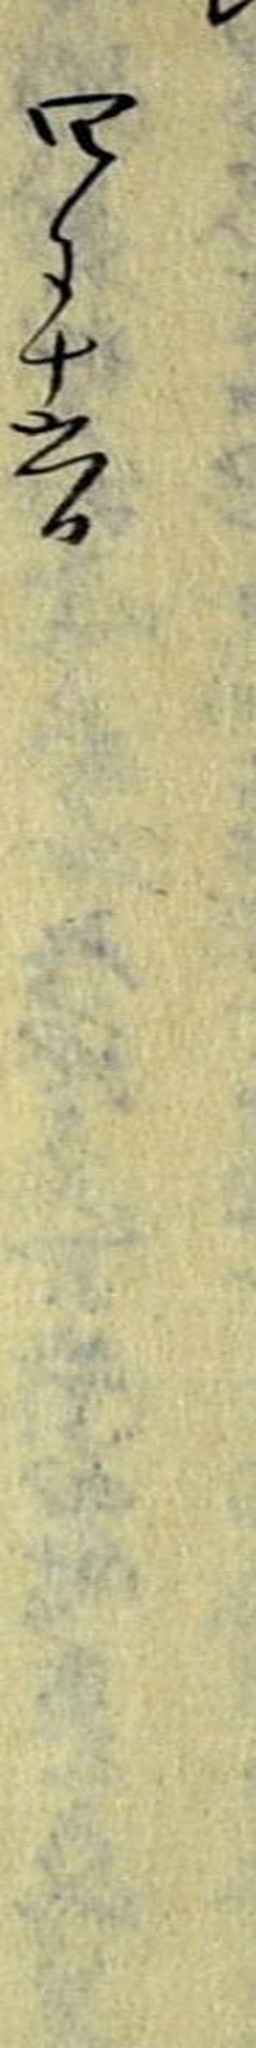四月十六日
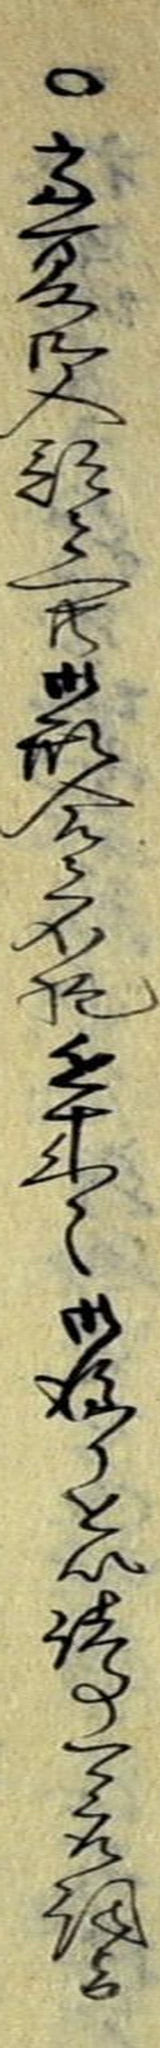○当夏御入部に候へ共御形合に不拘近来之御移りを以諸事可取調旨
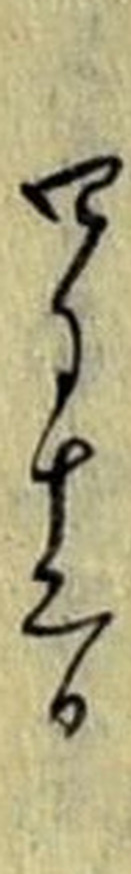四月十二日
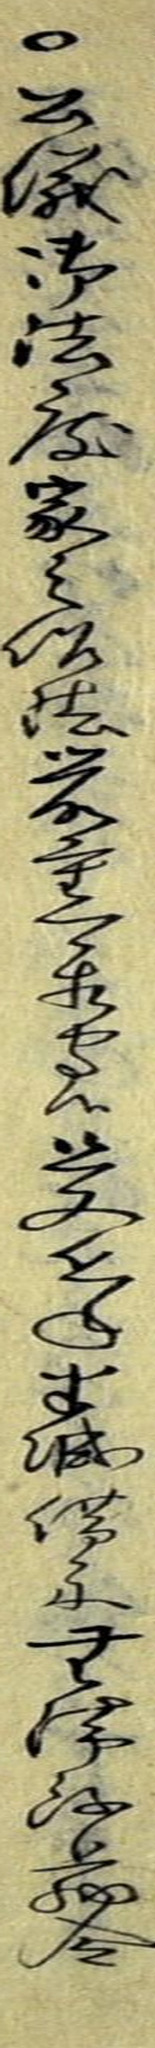○公儀御法度家々之作法厳重に可被相守候且又近年半減借米無滞致上納令
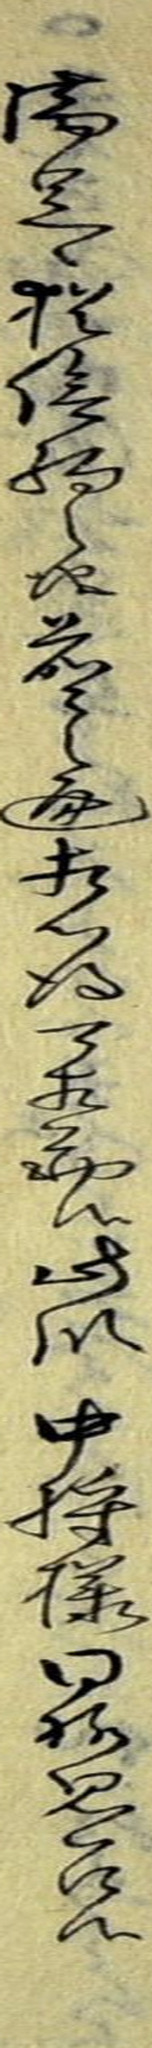満足候猶倹約之儀前々之通相心得可相勤候此段中将様同様思召候
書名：命令之部 四
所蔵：福井県文書館 Fukui Prefectural Archives
